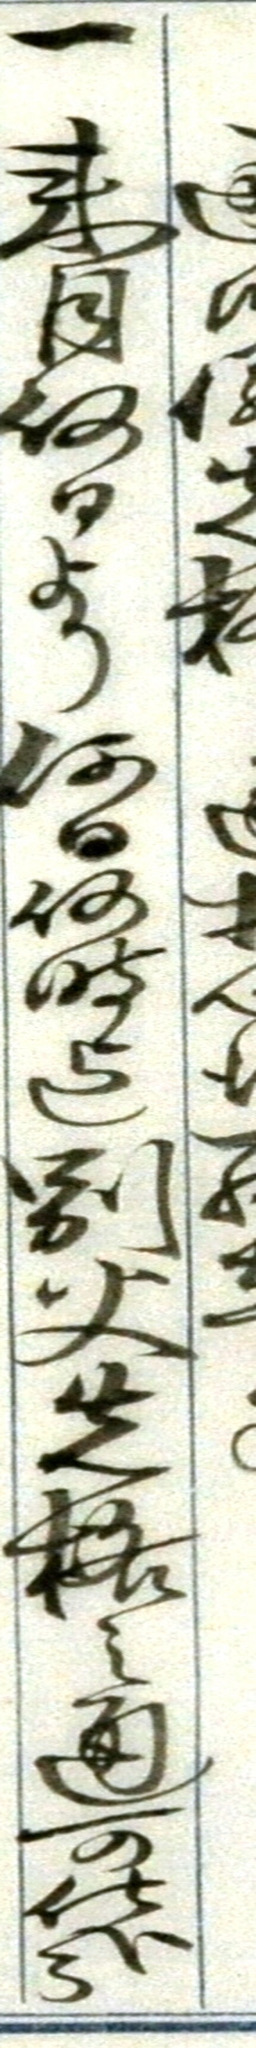一来月何日より何日何時迄別火先格之通可仕哉
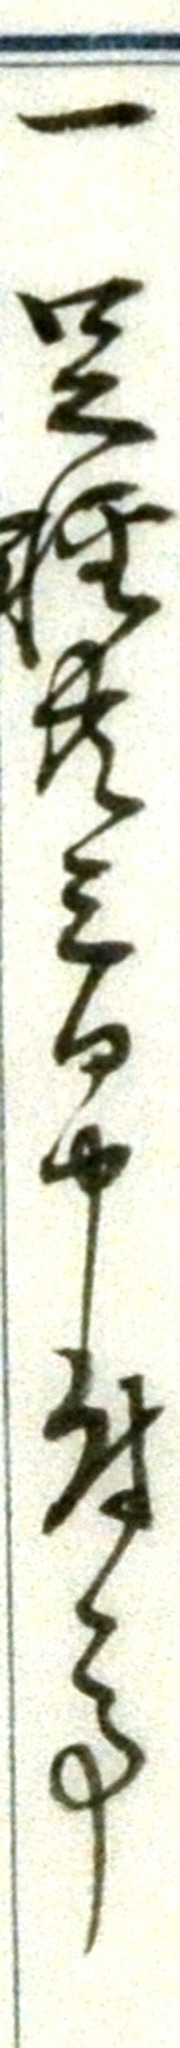一足軽共三日申付候事
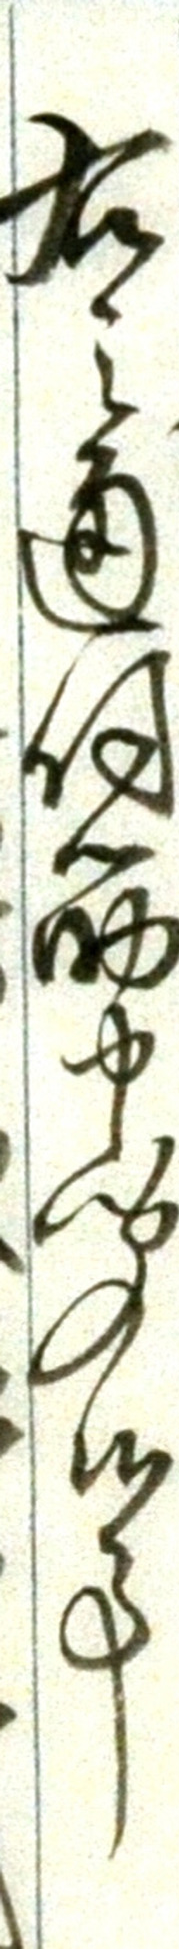右之通伺筋申聞候事
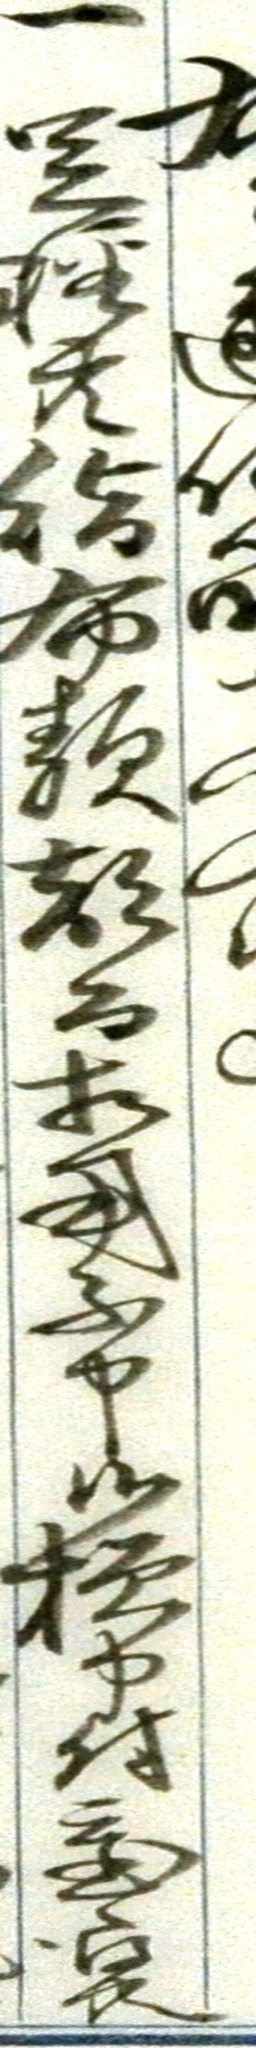一足軽共絹布類都而相用不申候様申付置候得共
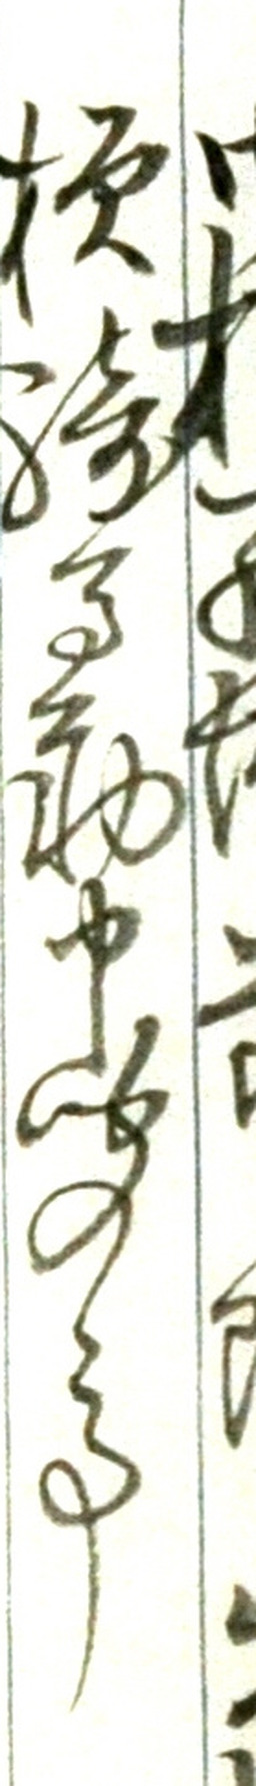様騎馬勤申聞候事

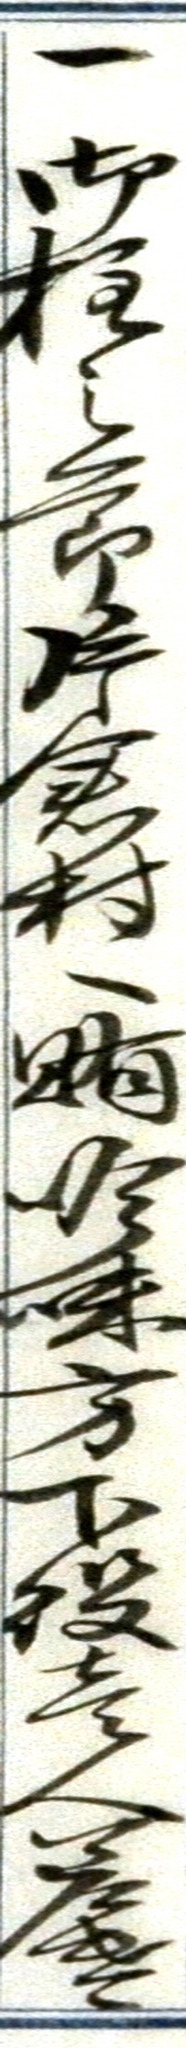一御柱之節片倉村へ賄吟味方下役壱人差遣候
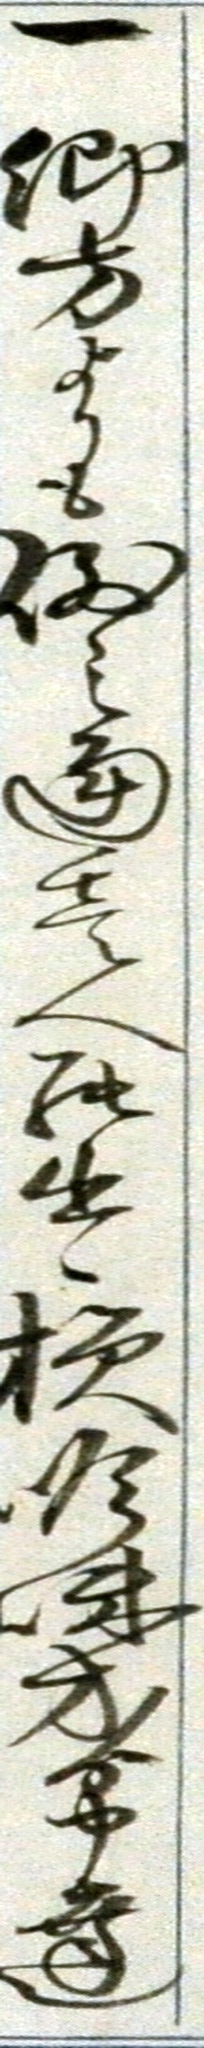一郷方よりも例之通壱人罷出候様吟味方ゟ申達
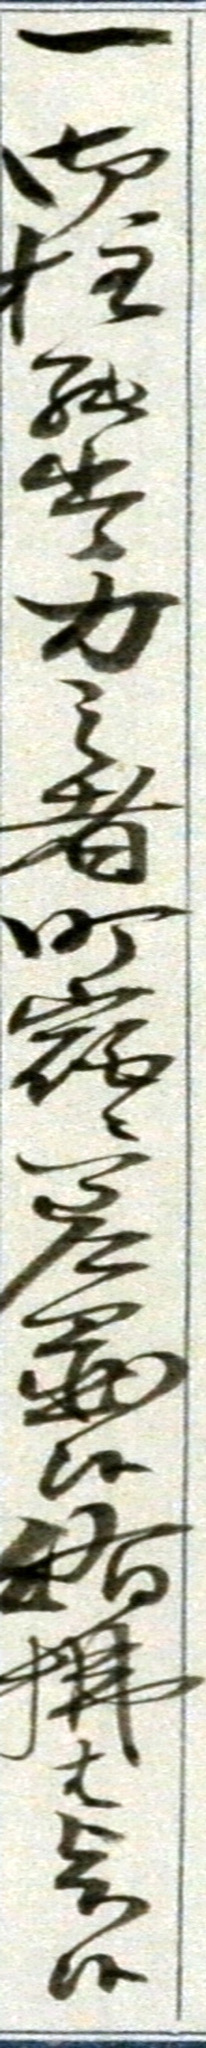一御柱罷出候力之者町宿ニ差置候賄払は被下候
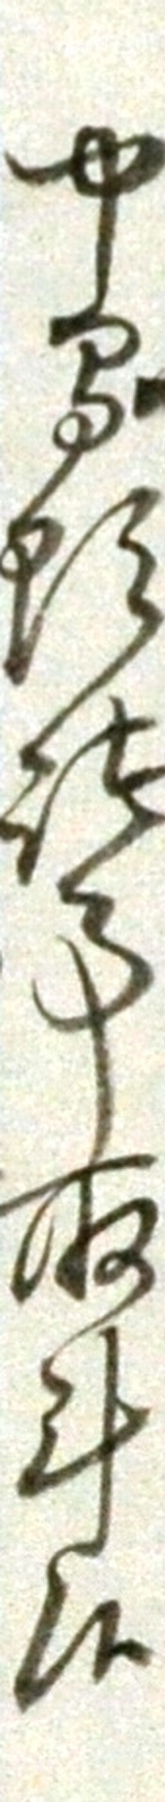中間頭諸事取計候
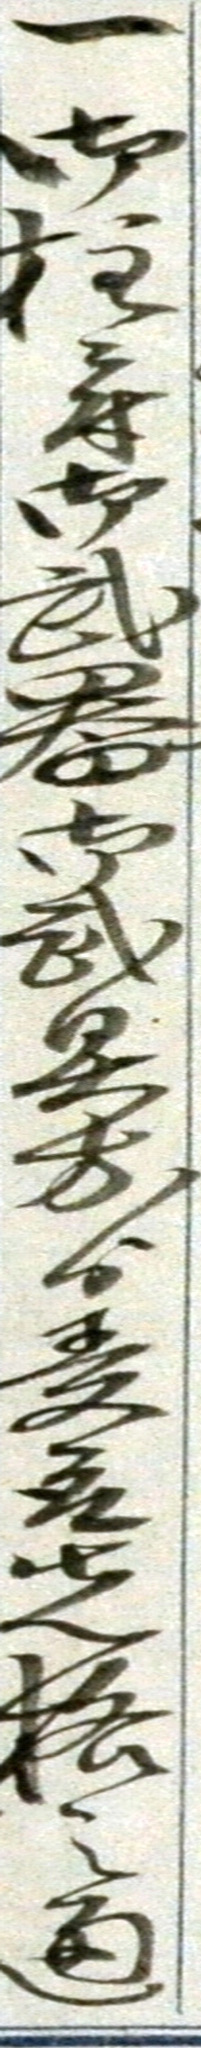一御柱ニ付御武器御武具方ゟ受取先格之通
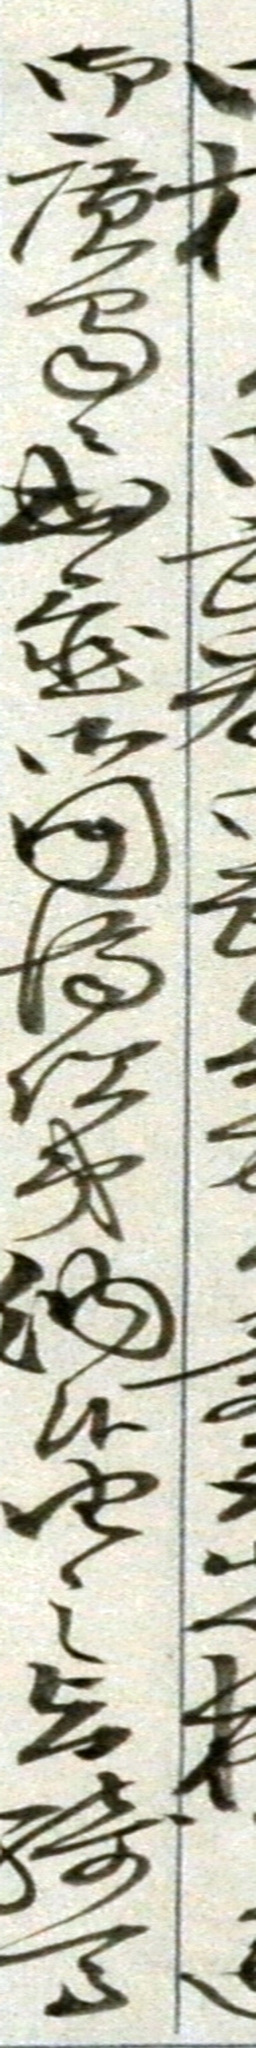御広間ニ出置候用済次第納候由之旨騎馬
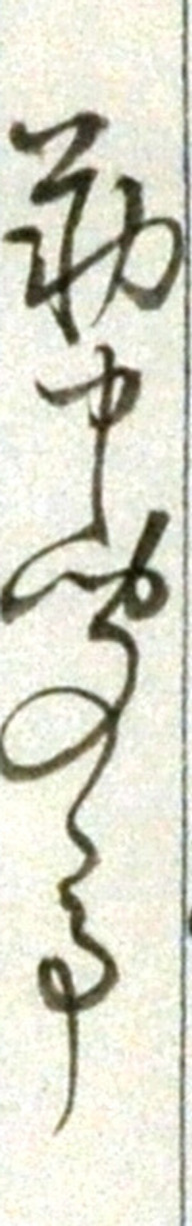勤申聞候事
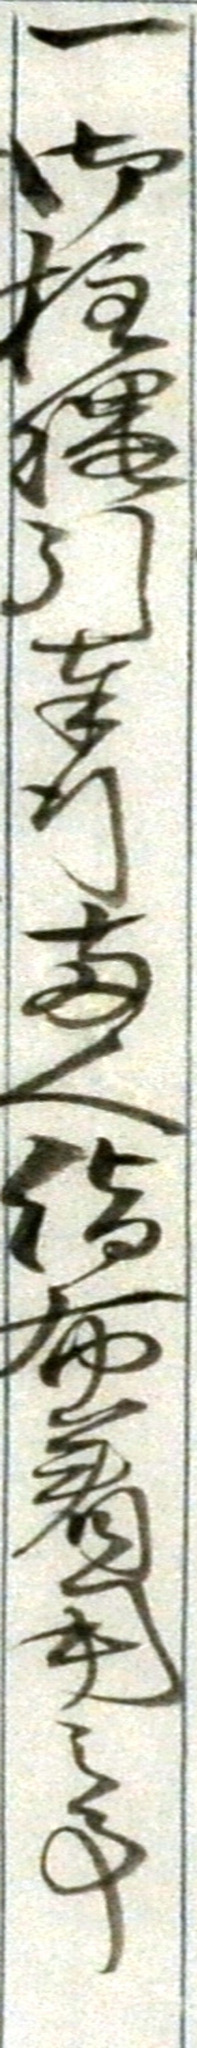一御柱縄引奉行両人絹布着用之事
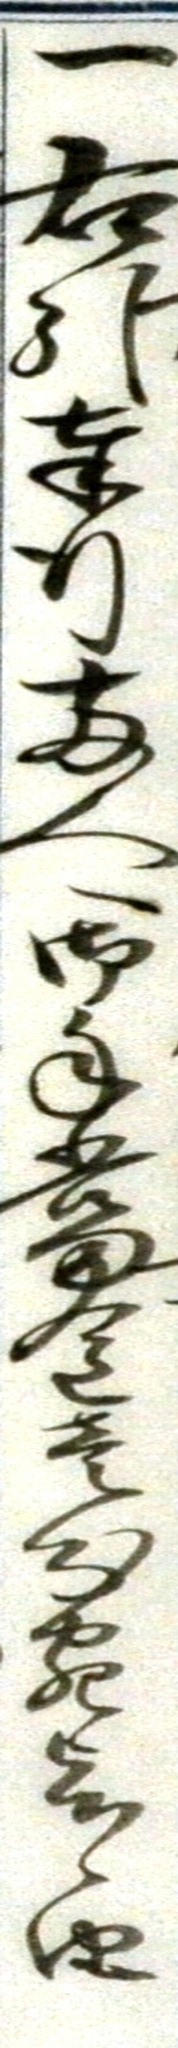一右引奉行両人へ御手当金一分宛被下候由
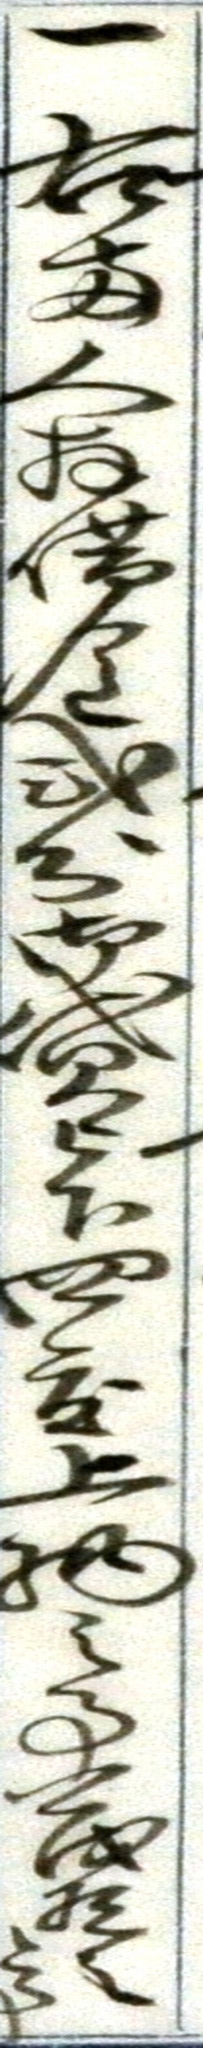一右両人拝借金弐分御貸被下四度上納之事も有之候事
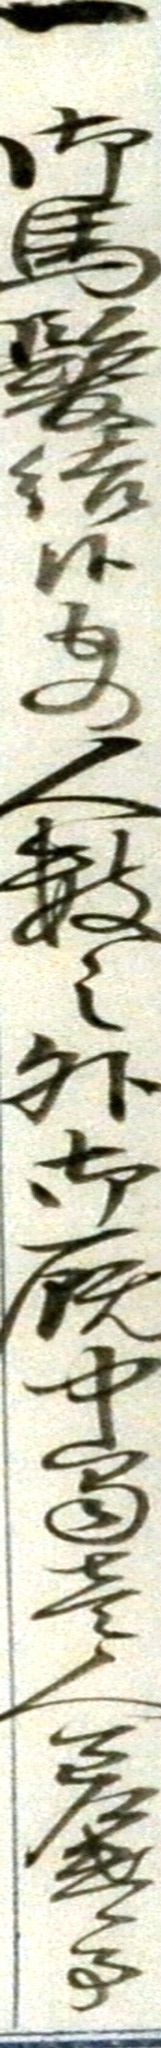一御馬髪結候もの人数之外御厩中間壱人差遣候事
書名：諏訪御柱祭之節・騎馬大将御中間頭・御柱引人足
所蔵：伊那市立高遠町図書館・合同会社AMANE
